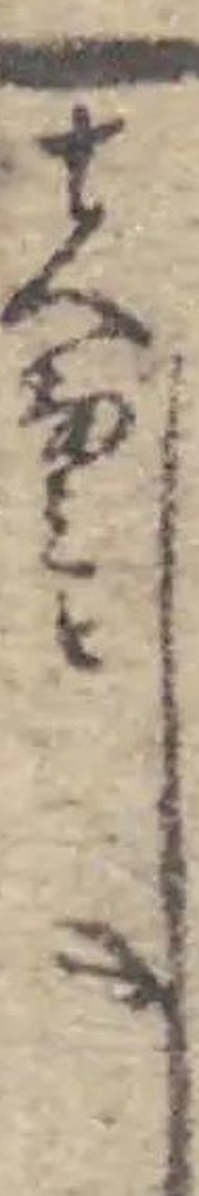十人なみと
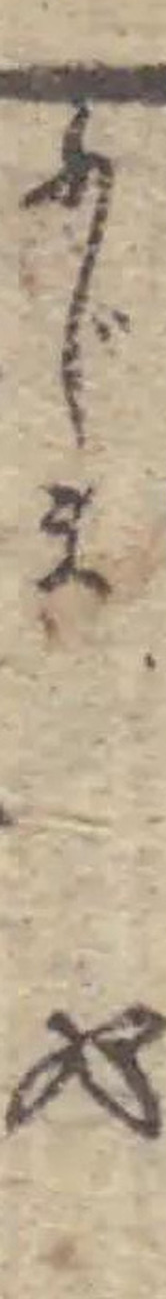ふじま
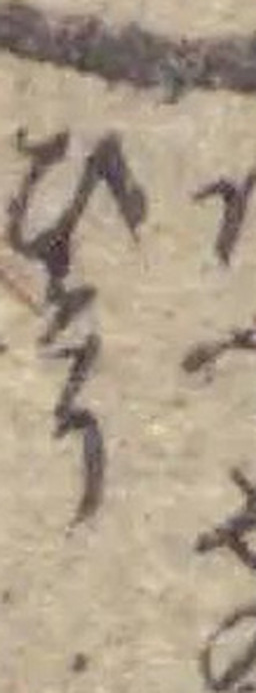ひとり
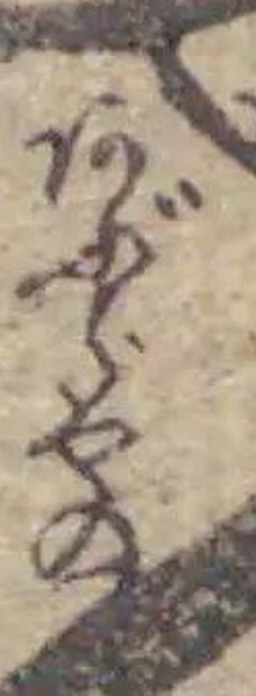あぶらやの
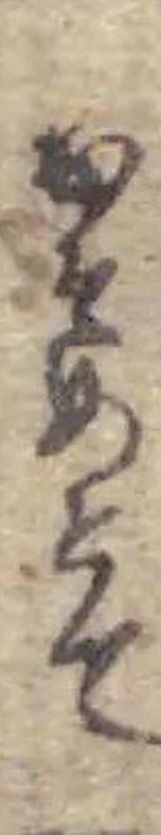おそめとて
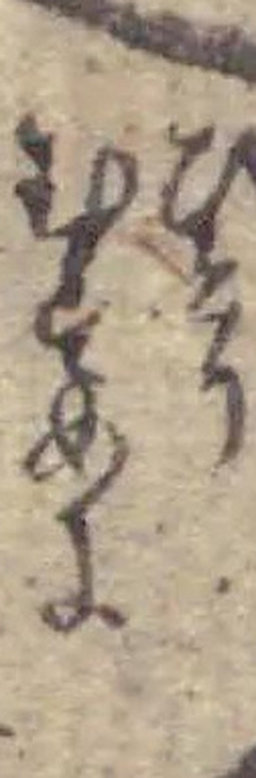むすめに
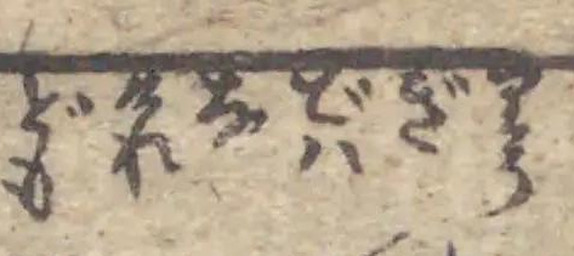させる
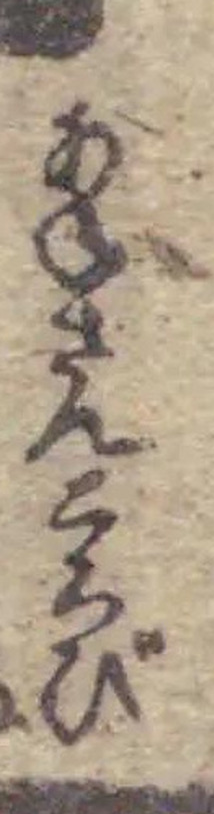あねさんころび
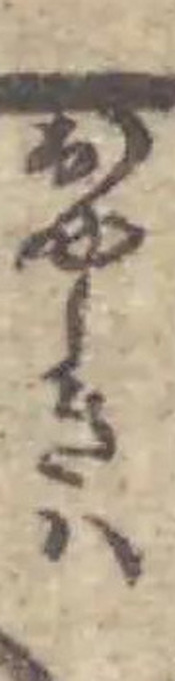おやしきは
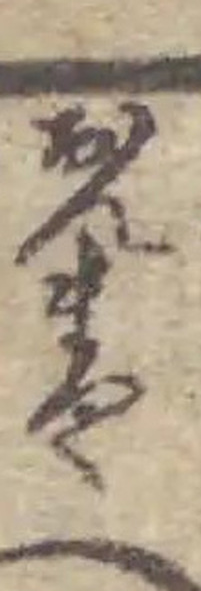おんまや
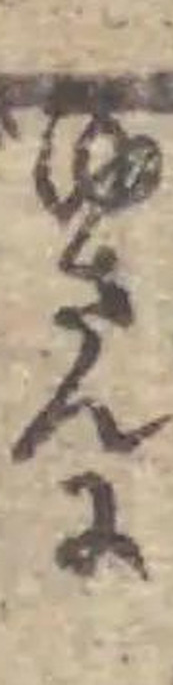ゆさんに
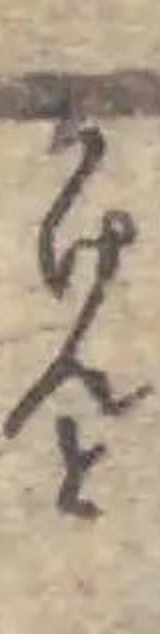かけんと
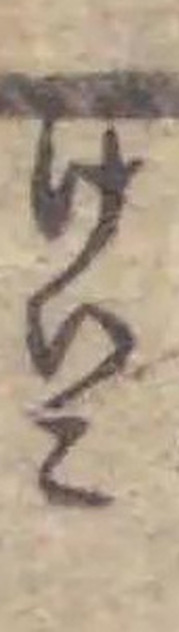けいこ
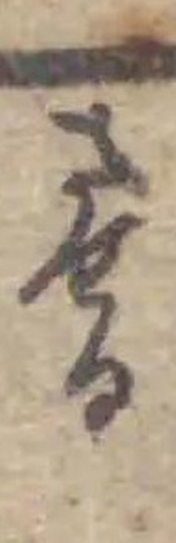させる

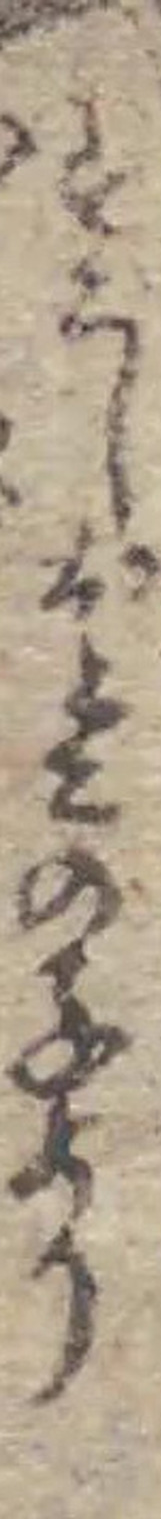すこしおとこの子より
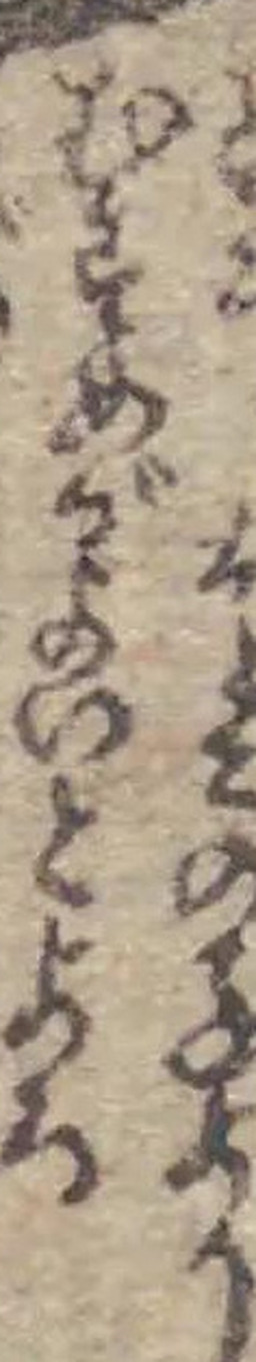むすめがよいとよろ
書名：蟹牛房挟多 3巻
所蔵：国立国会図書館 National Diet Library, JAPAN
